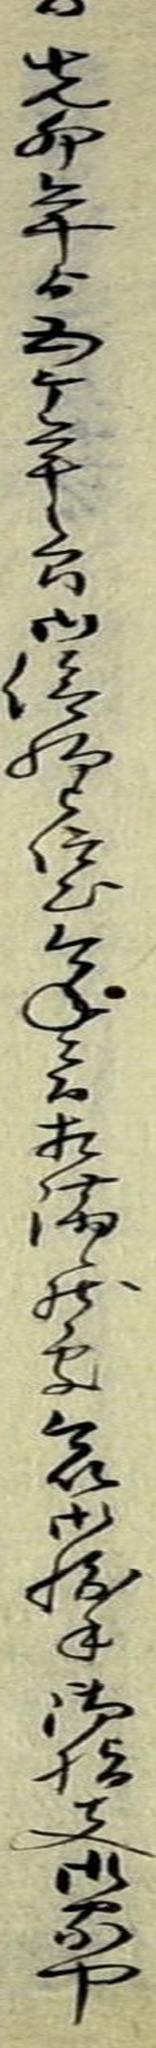〇先卯年ゟ五ヶ年之間御倹約被仰出今年に而相満候然処今以御勝手御指支御家中
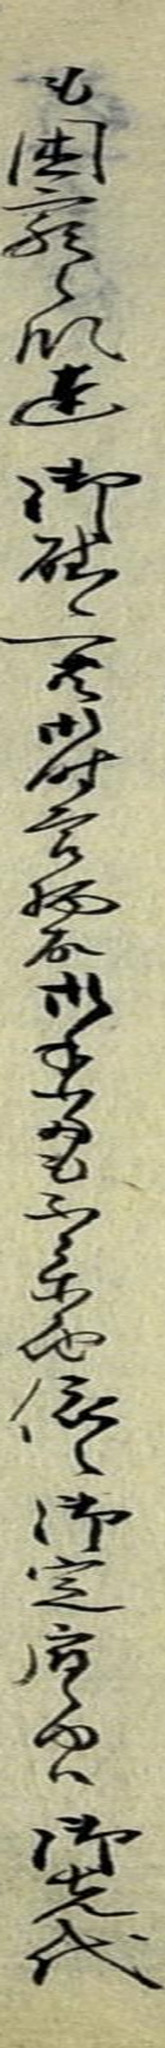も困窮之段達御聴候へ共御時節柄故御手当も不参由依之御定府之内は御先代
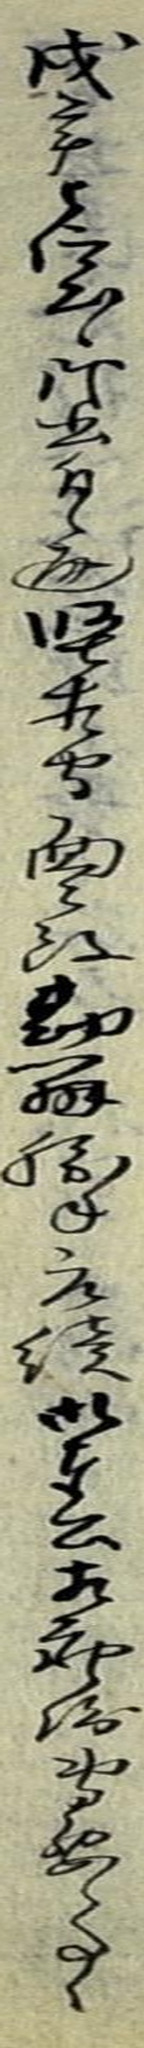戌年被仰出候御書付之通堅相守面々致勘弁勝手取続御奉公相勤儀専要事候
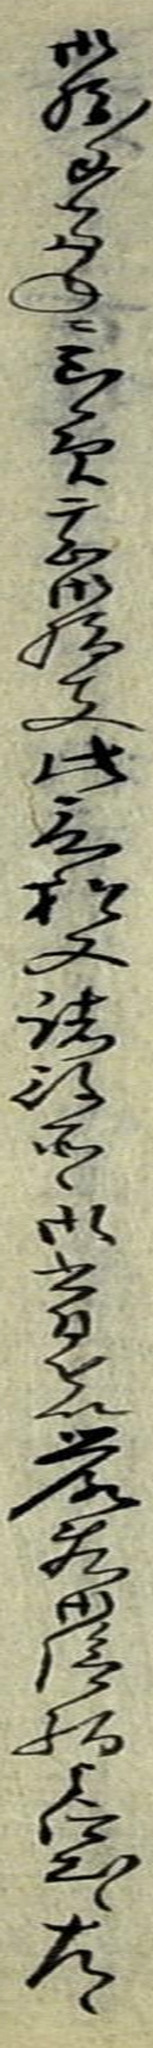御勝手当年に至候而は甚御指支此度猶又諸役所へ御書付を以厳敷御倹約被仰出候左候
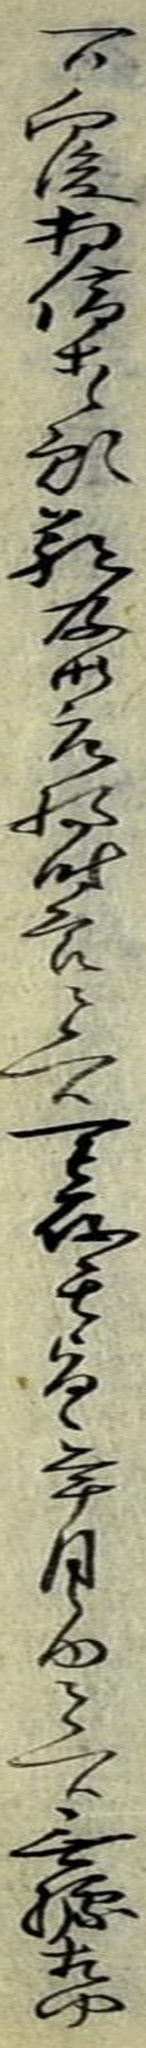へは向後拝借等之願難及取揚時節に候へは可被存其旨候年月之内に候へは無拠相ゆ
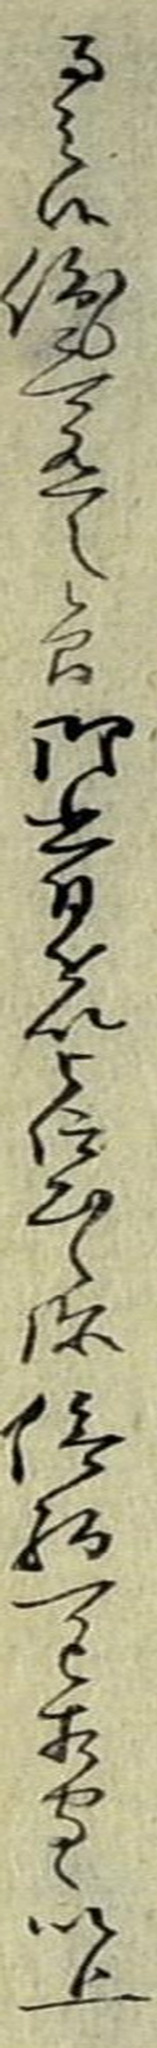るみ候儀も可有之候間御書付を以被仰出候弥倹約可被相守候以上
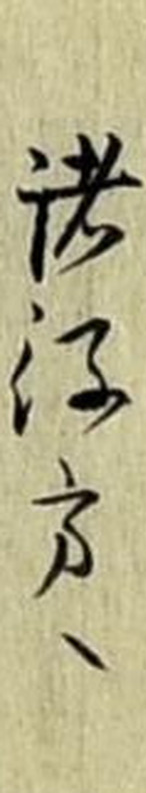諸役方へ
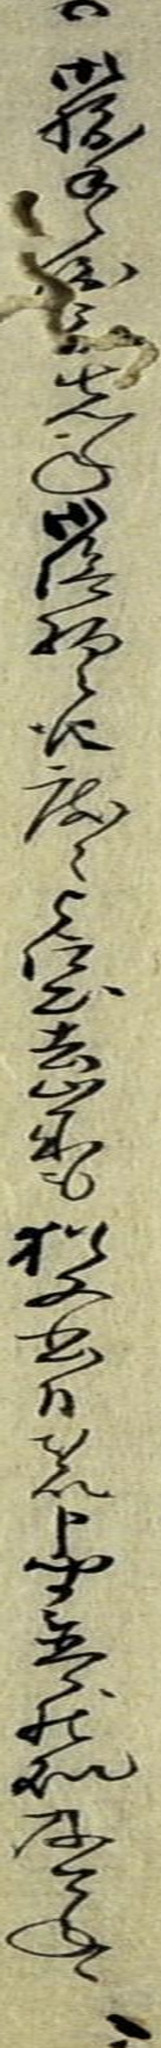〇御勝手之儀に付先年御倹約之儀度々被仰出去歳も猶又書付を以申聞置候然処及今年候
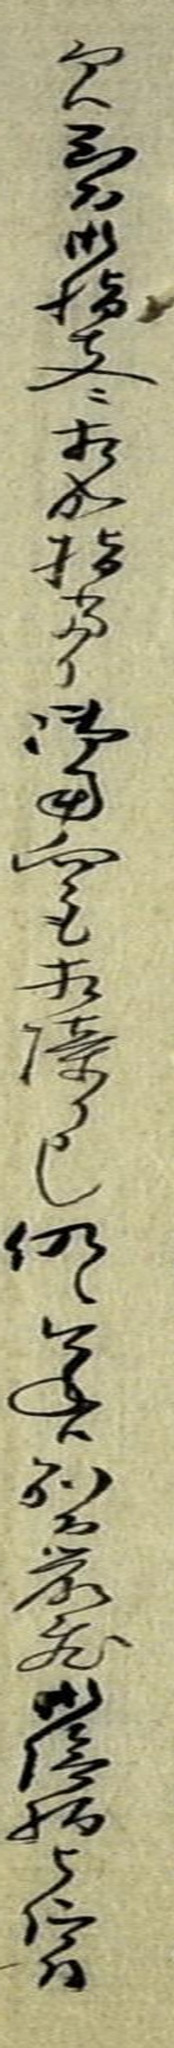而は至而御指支に相成指当り御用向にも相障り申候仍之今年は別而厳敷御倹約被仰付
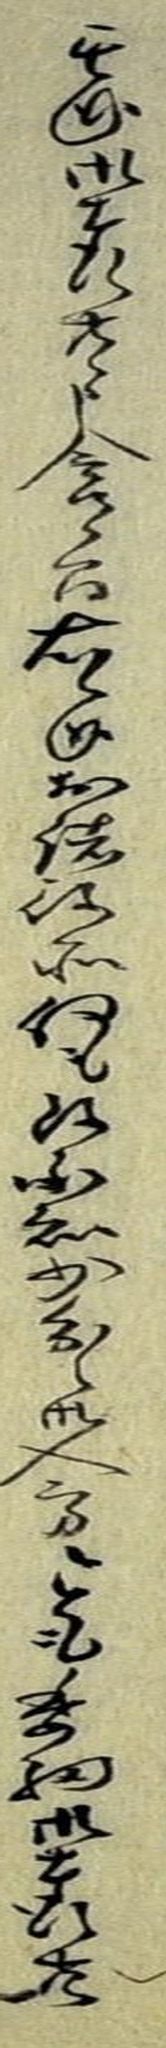其趣御奉行共へ申含候間右之趣於諸役所何も致承知少分之御入方候とも委細御奉行共
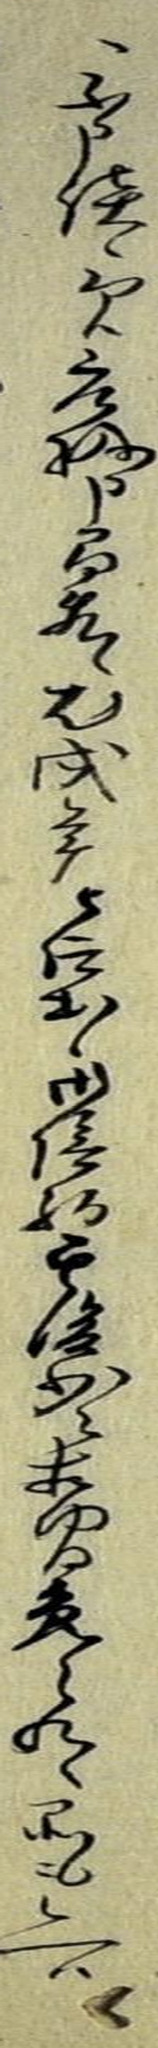へ不申談候而は取扱申間敷候尤戌年被仰出候御倹約其後少々相ゆるめられ候品も候へは
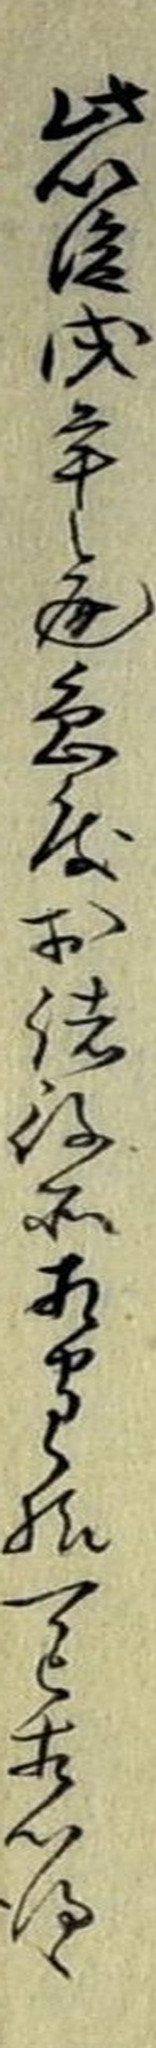此以後戌年之通急度於諸役所相守候様可被相心得候
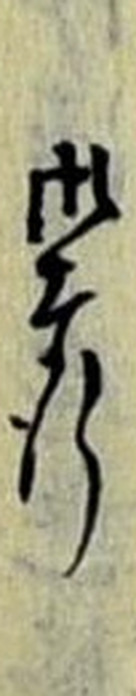御奉行
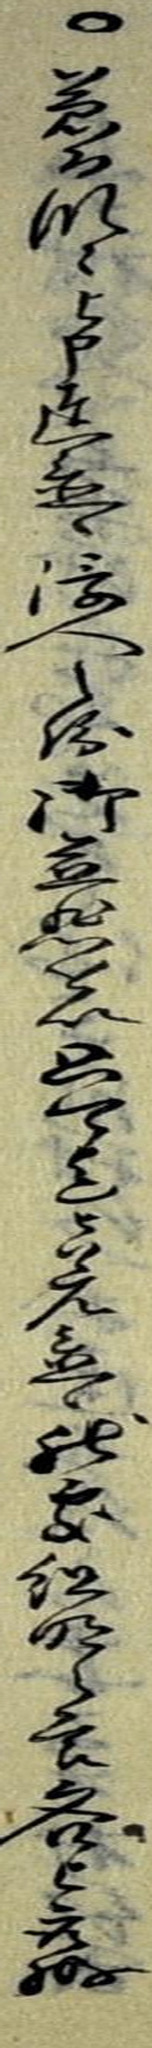〇兼而段々被申達置候浮人之儀御慈悲を以只今迄被差置候然処組明之節各被取扱
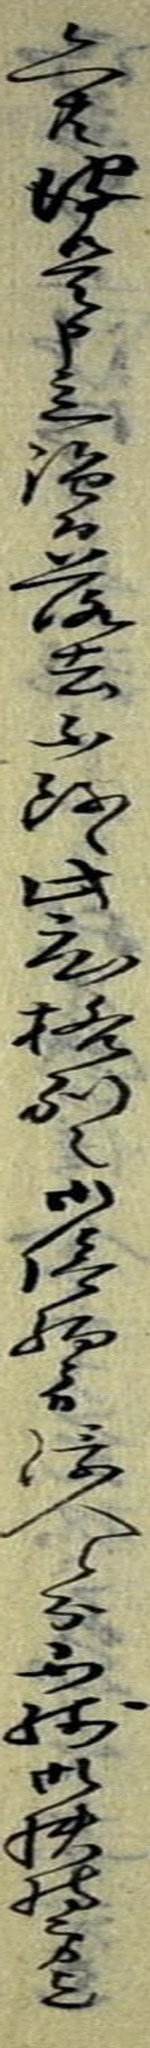候へ共彼是申立強而落去不致候此度格別之御倹約に付浮人之分不残御扶持方迄
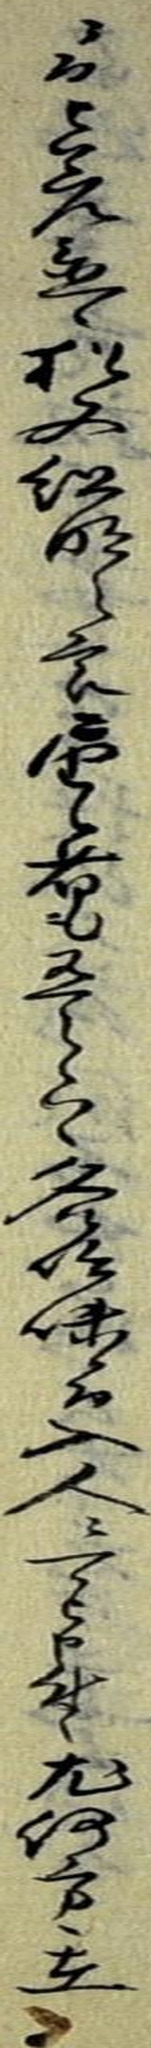に而被差置候猶又組明之節望候者も有之候はゝ各吟味候而入人に可被申付候尤何方へ在
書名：命令之部 二
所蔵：福井県文書館 Fukui Prefectural Archives
